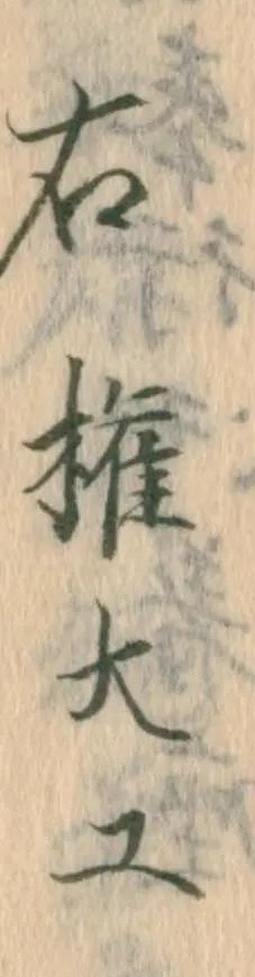右権大工
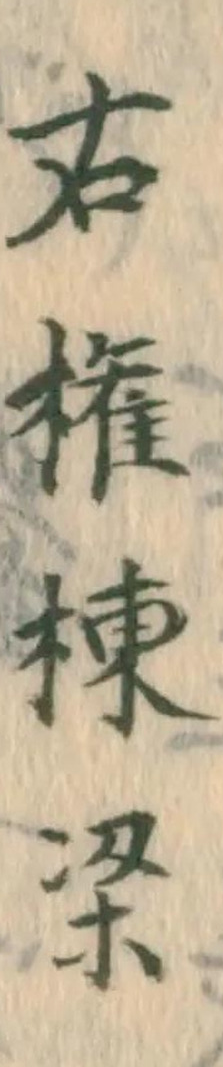右権棟梁
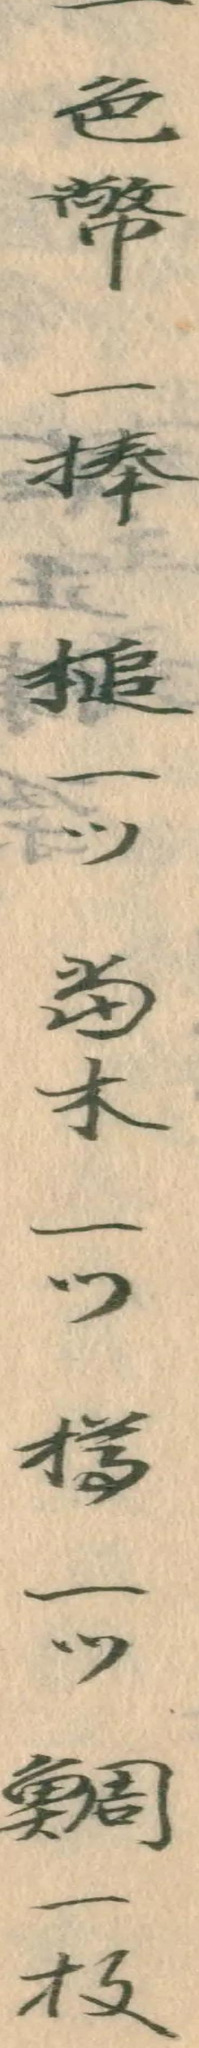一色幣一捧槌一ツ当木一ツ樽一ツ鯛一枚
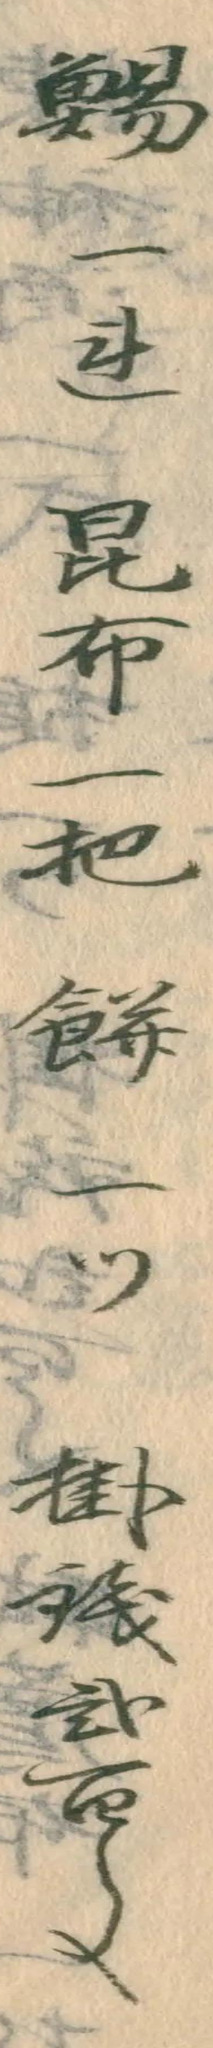鯣一連昆布一把餅一ツ掛銭弐百文
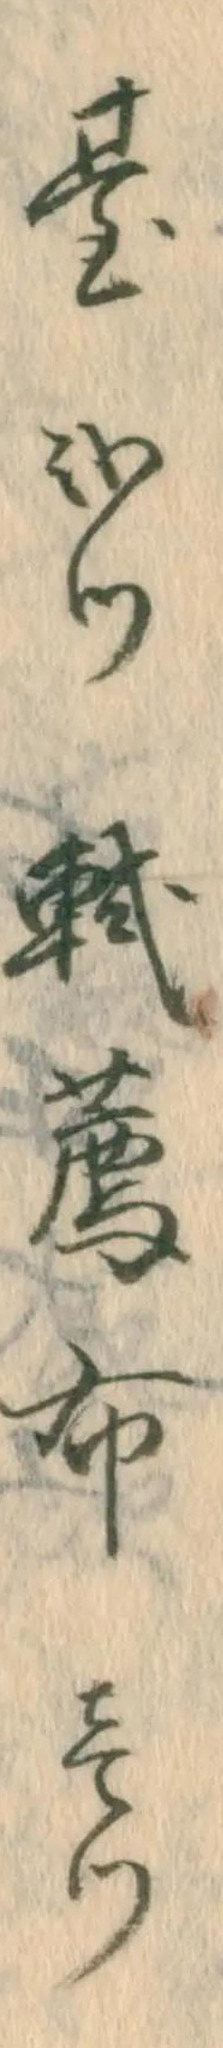台弐ツ軾薦布壱ツ
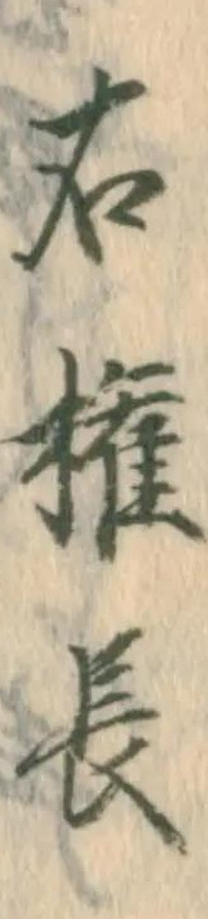右権長
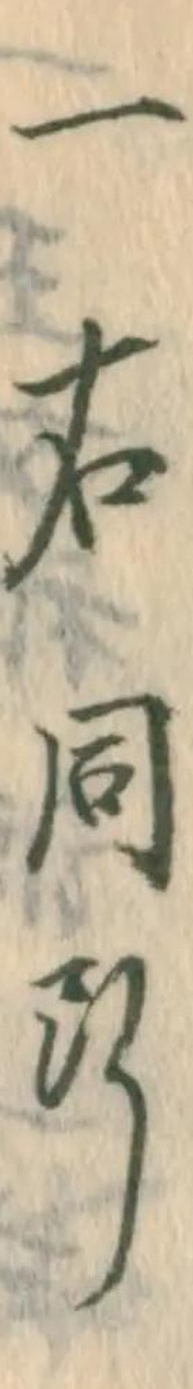一右同断
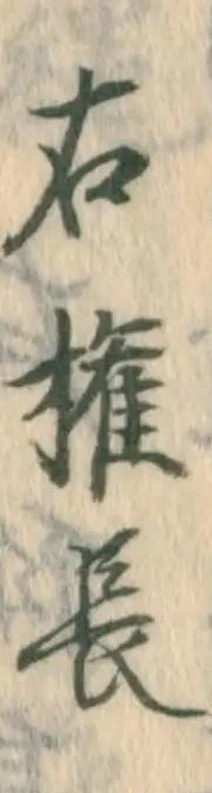右権長
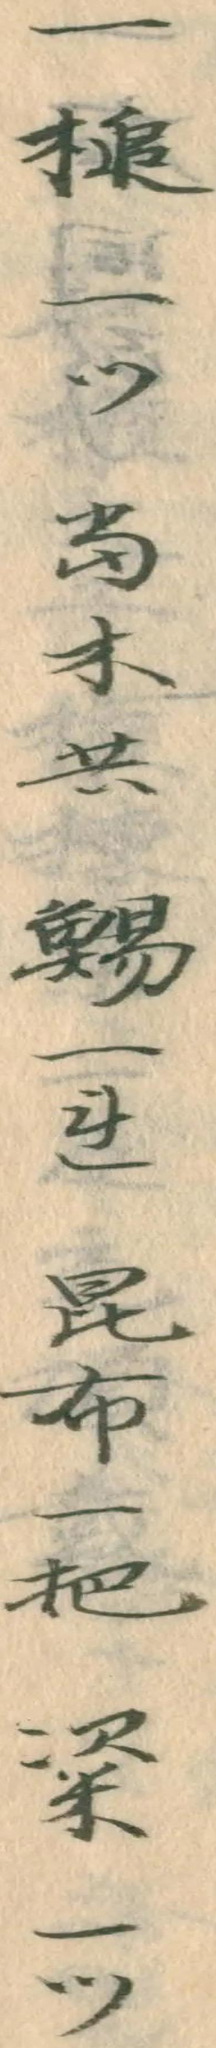一槌一ツ当木共錫一連昆布一把粢一ツ
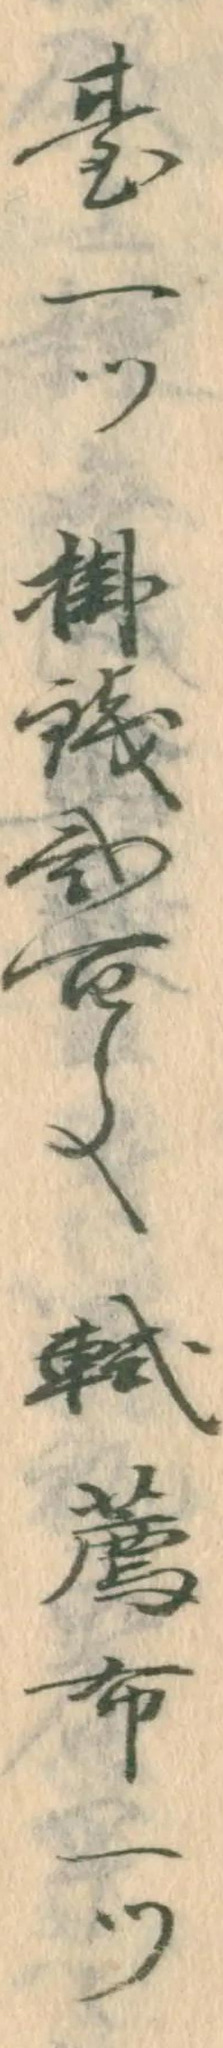台一ツ掛銭弐百文軾薦布一ツ
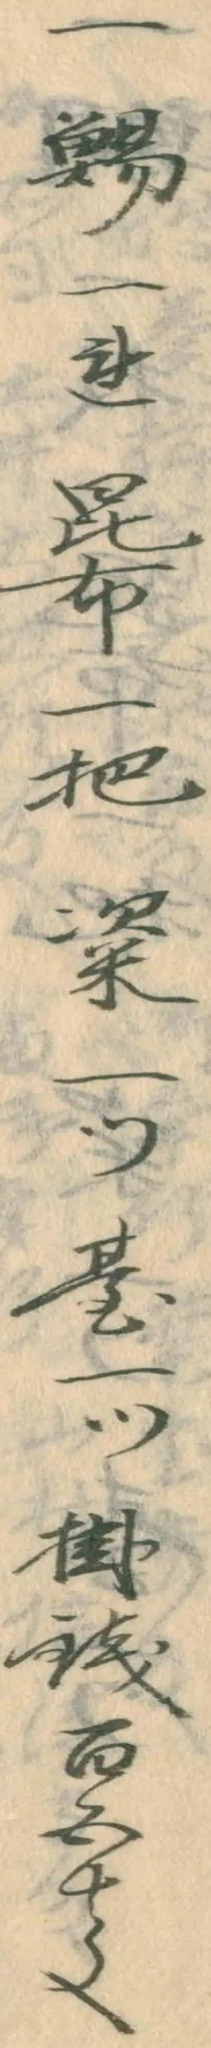一鯣一連昆布一把粢一ツ台一ツ掛銭百五十文
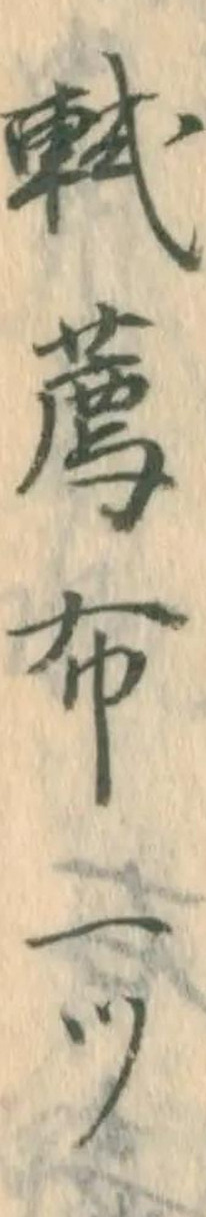軾薦布一ツ

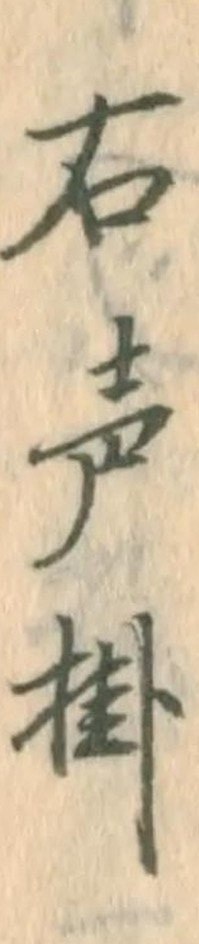右声掛
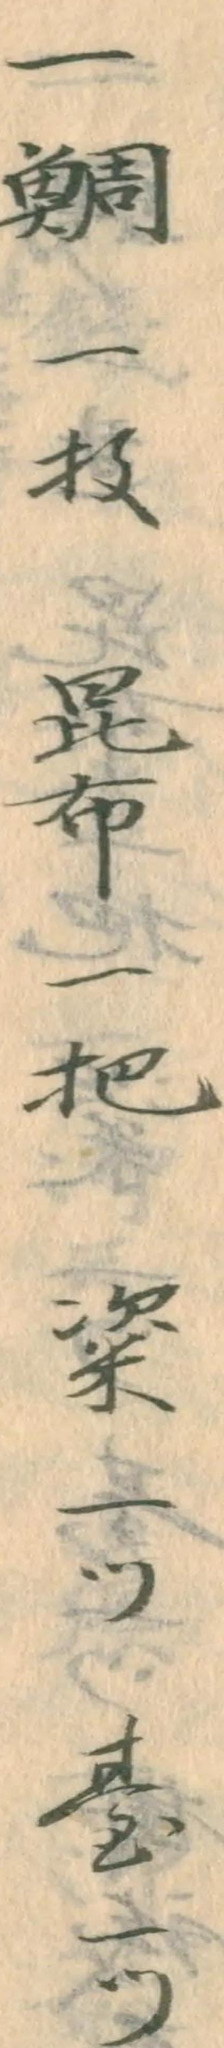一鯛一枚昆布一把粢一ツ台一ツ
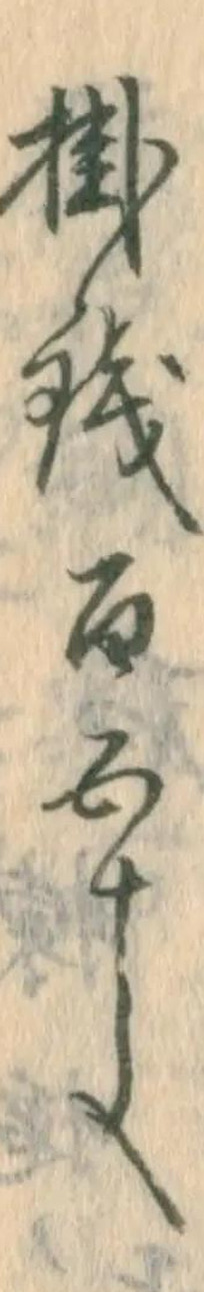掛銭百五十文
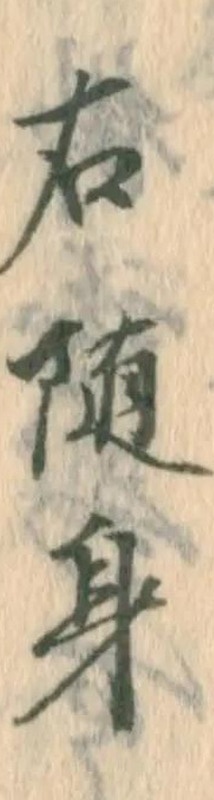右随身
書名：賀茂社記録. 第17冊
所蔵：国立国会図書館 National Diet Library, JAPAN
